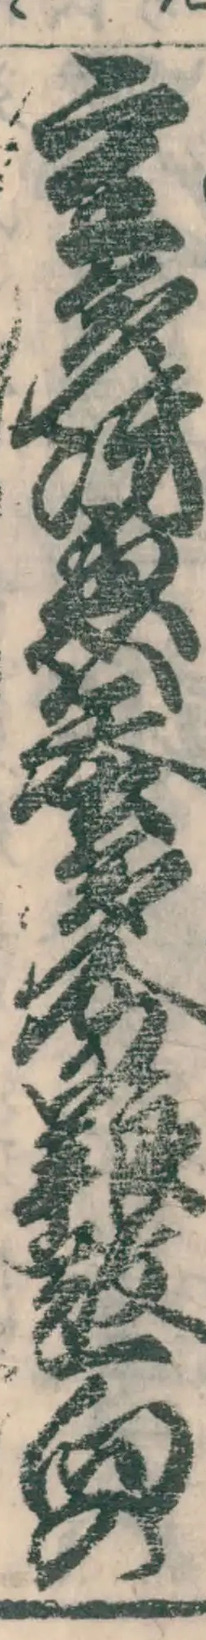重多冴悪は蚕多分養散一向の

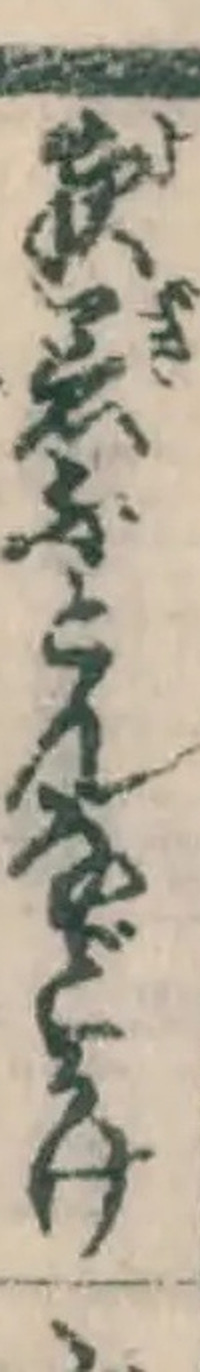夜着ふとんなどかけ
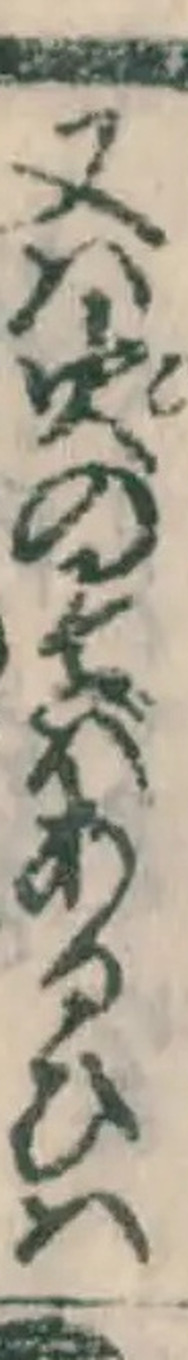又は火のそばあるひは
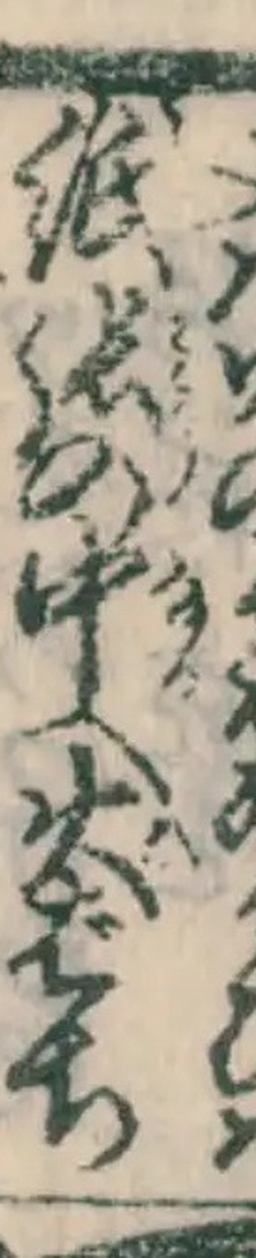紙張の中へ火ばち
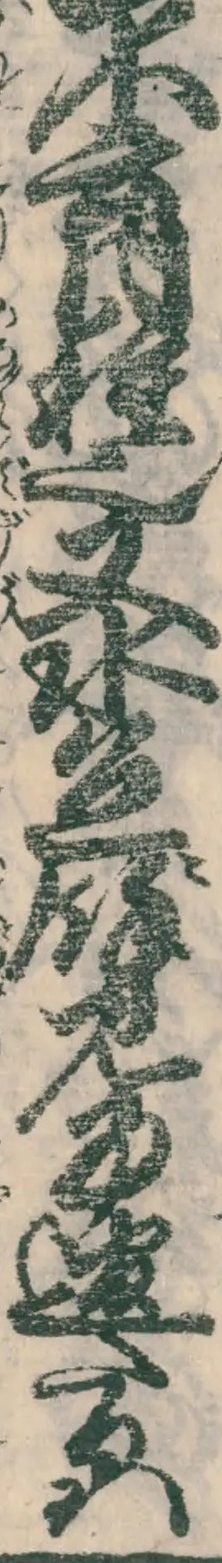不育種也又水色に餘見事過たるは
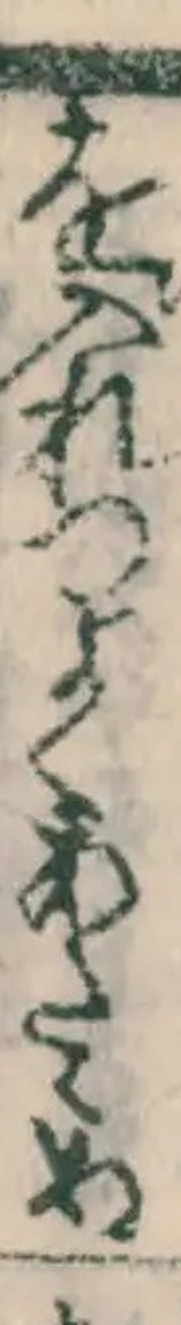を入れつよくあたゝめ
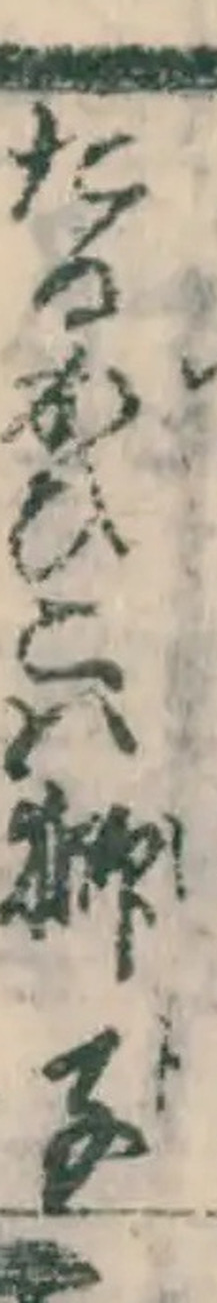たるかひこは獅子
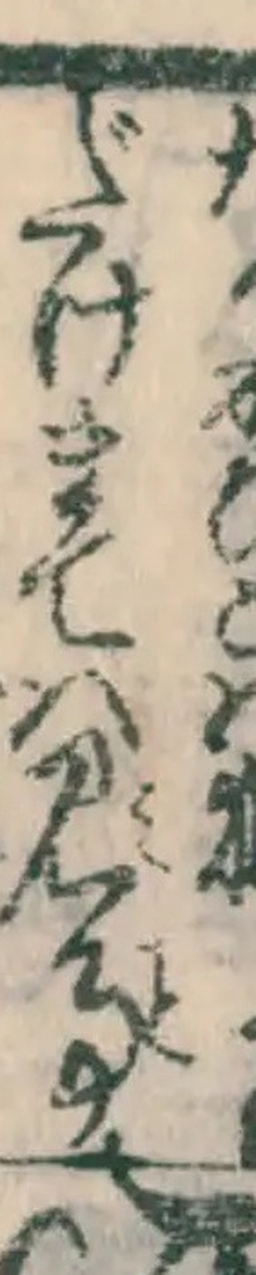だけまては見事
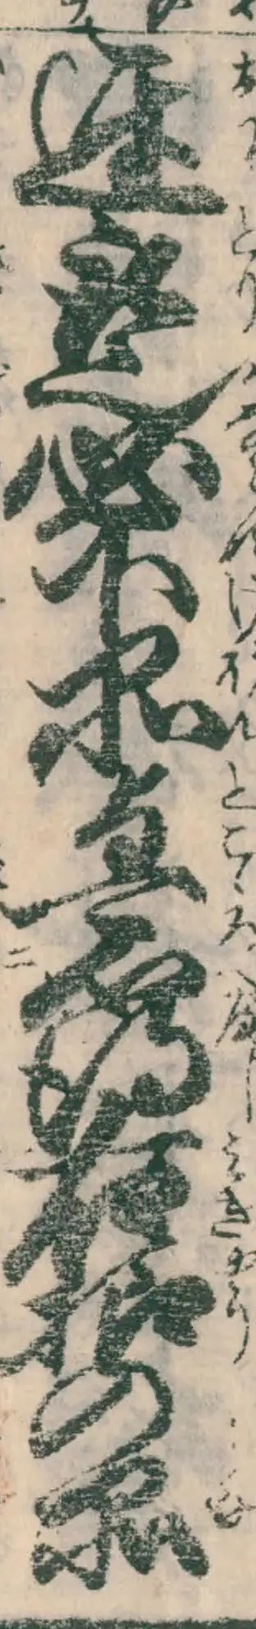遅取也必下品与可心得右様の品
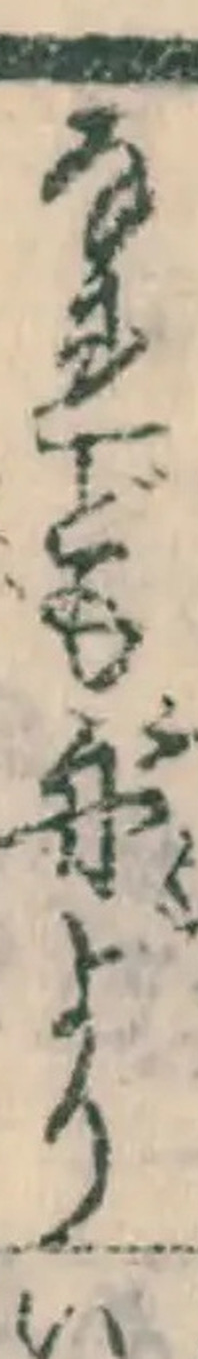なれども舟より
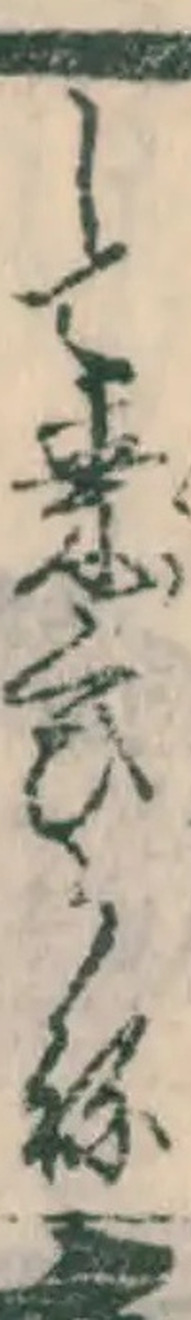して桑くひかね
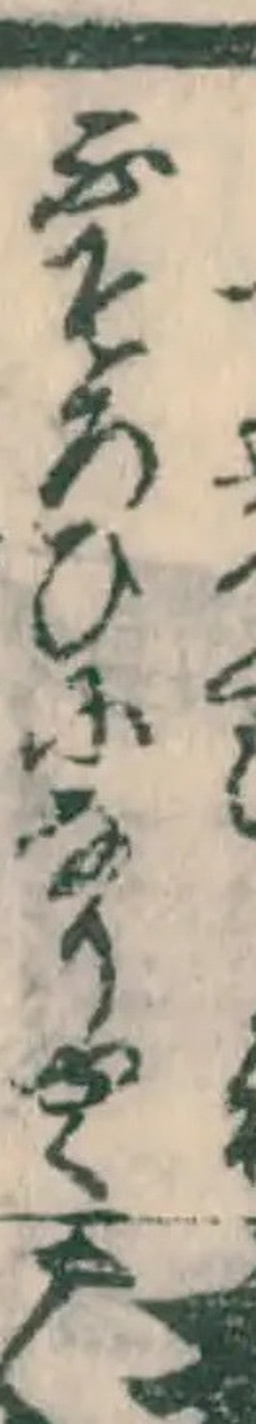ふそろひになりゆく
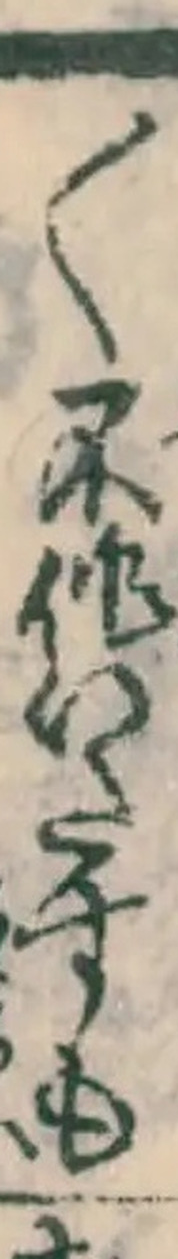〳〵不作いたすも
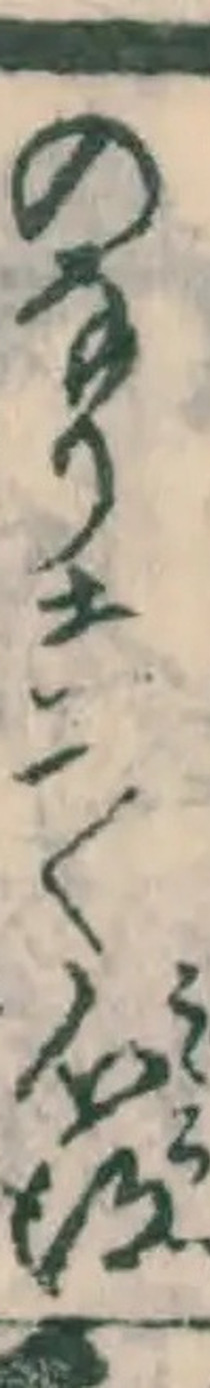のなりあつく心得
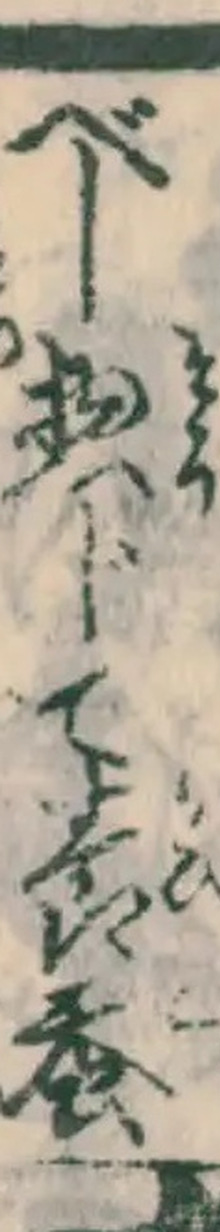べし惣じて養蚕
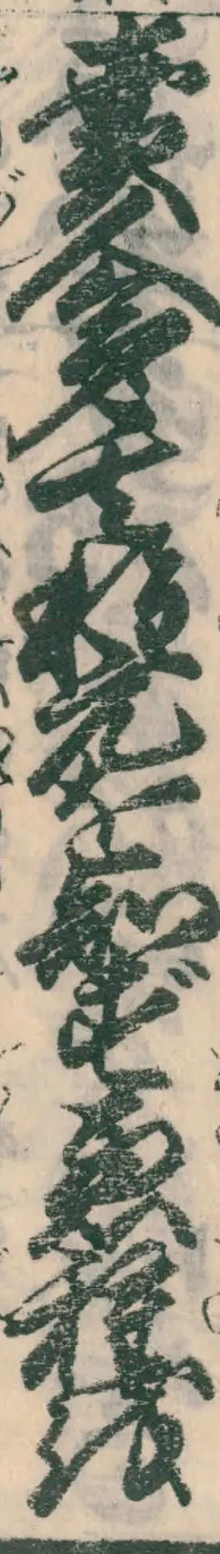売人多其種元を知ず悪種を
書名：養蚕往来
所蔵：国立国会図書館 National Diet Library, JAPAN
